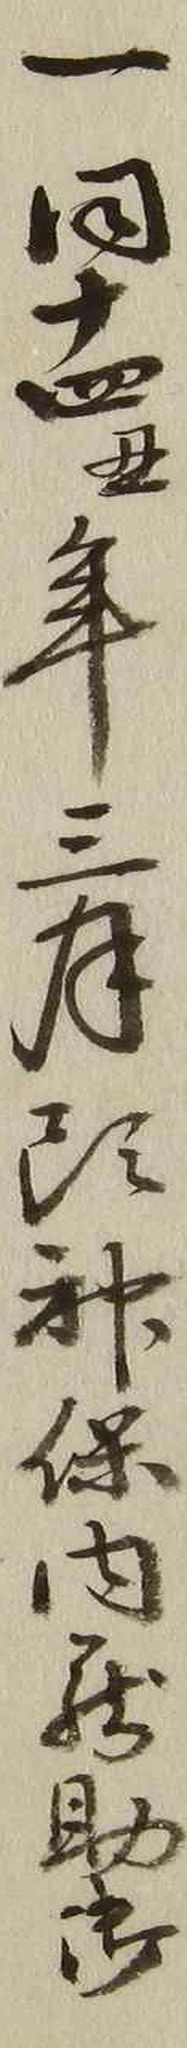一同十四丑年三月頭神保内蔵助御
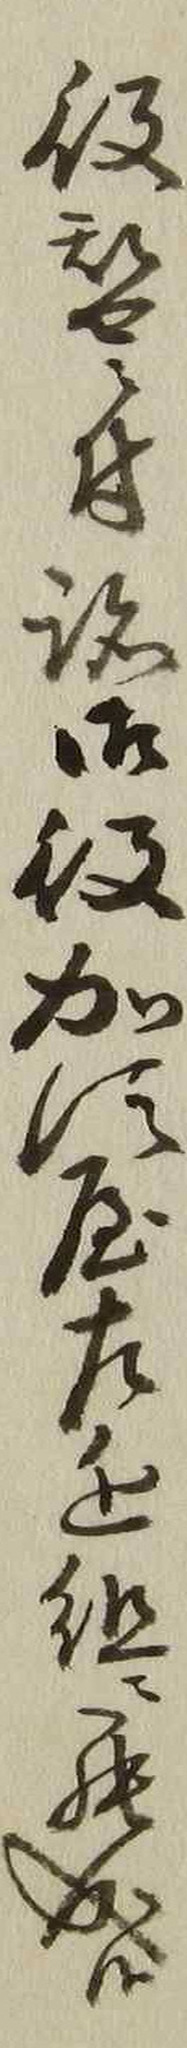役替ニ付跡御役加須屋左近組ニ罷成候
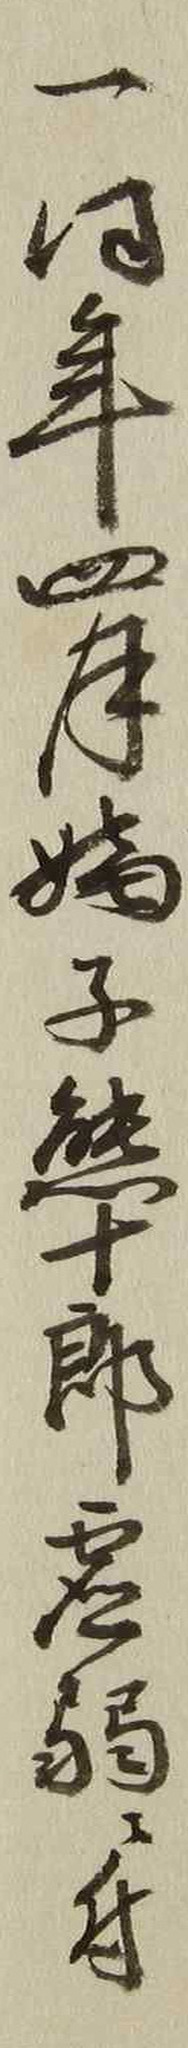一同年四月嫡子熊十郎虚弱ニ付
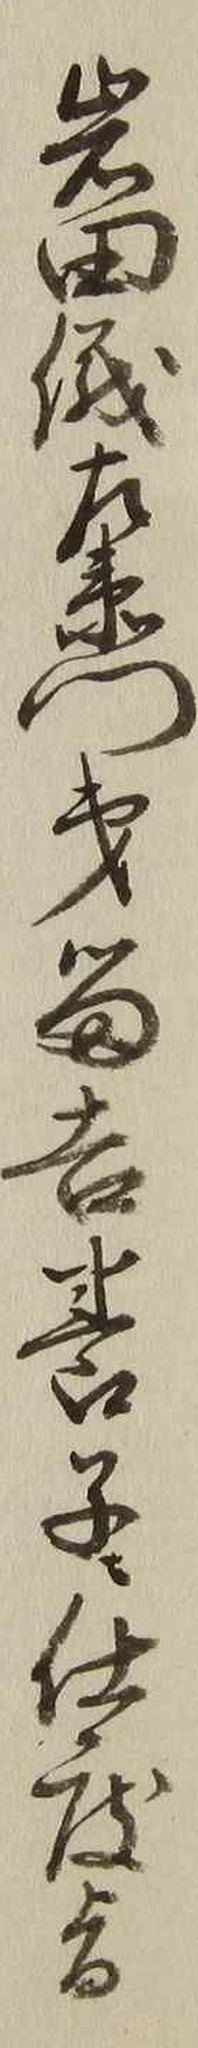岩田儀左衛門弟留吉養子ニ仕度旨
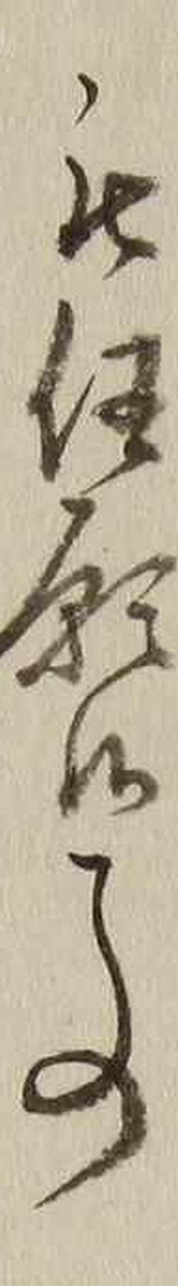被任願候事
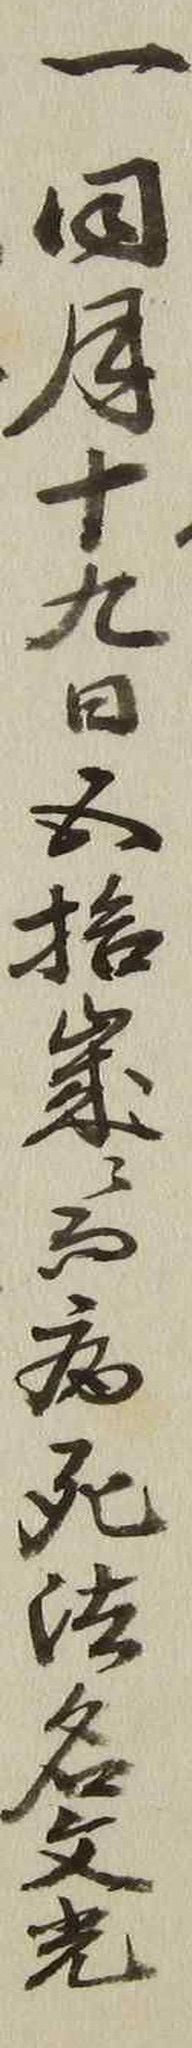一同月十九日五拾歳ニ而病死法名文光
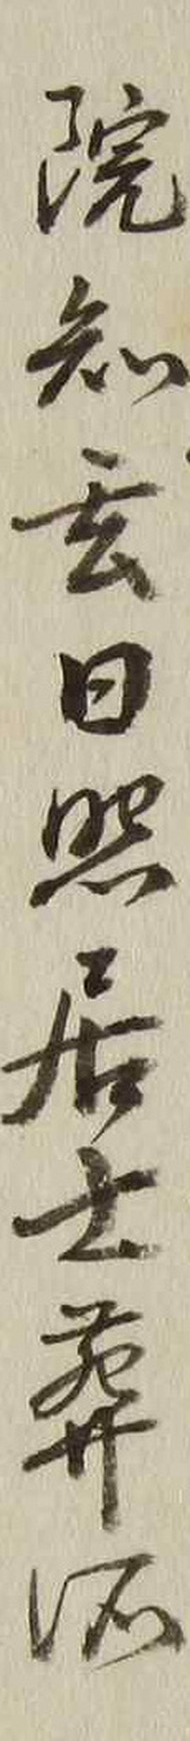院知玄日照居士葬所
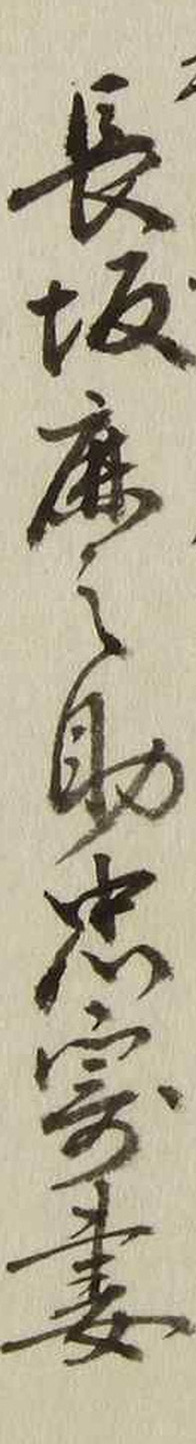女長坂鹿之助忠寄妻
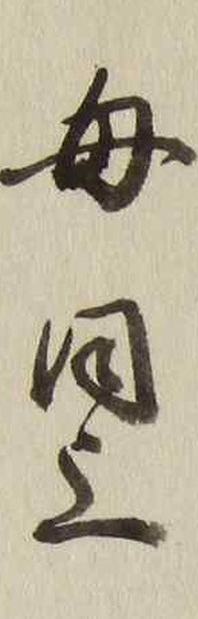母同上
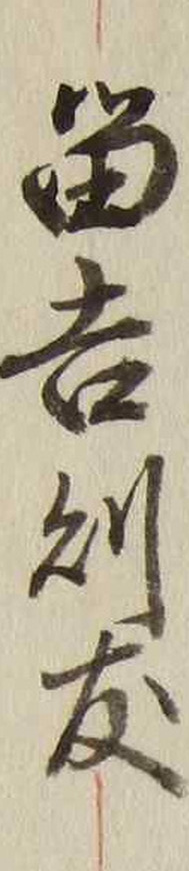留吉則友

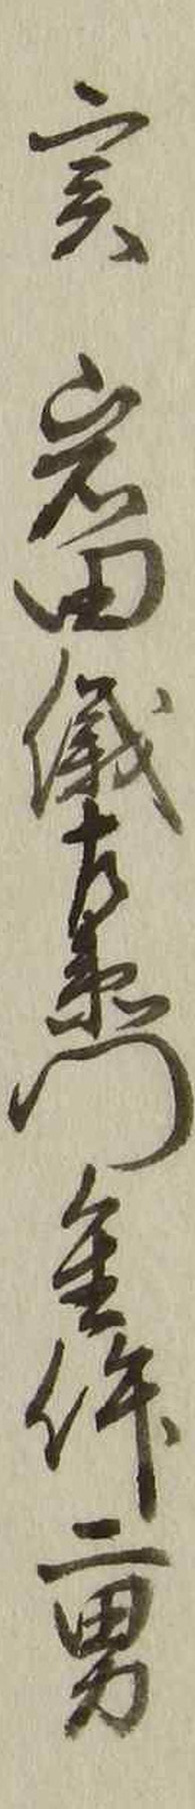実岩田儀左衛門金仰二男
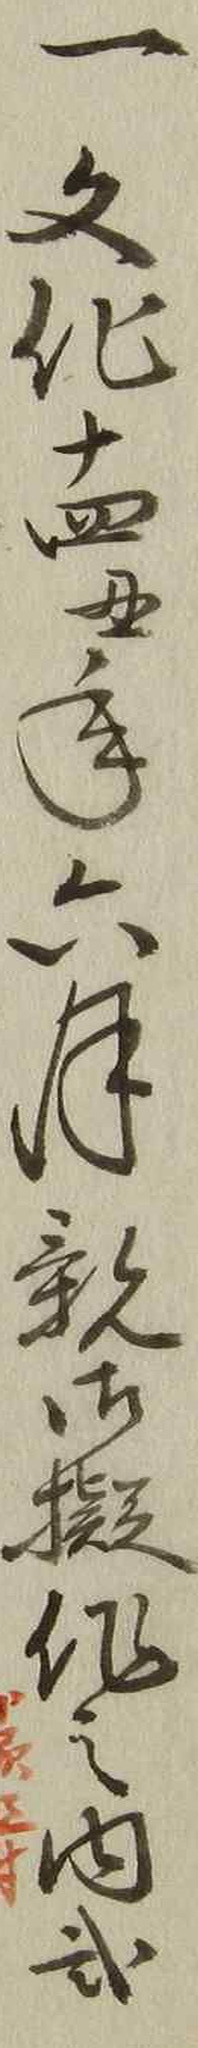一文化十四丑年六月親御擬作之内弐
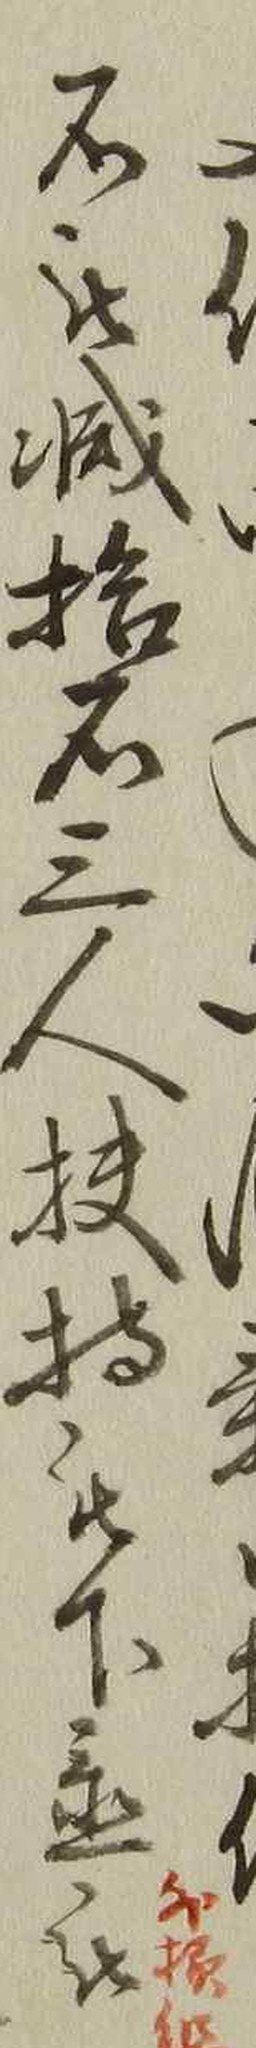石被減拾石三人扶持被下置被
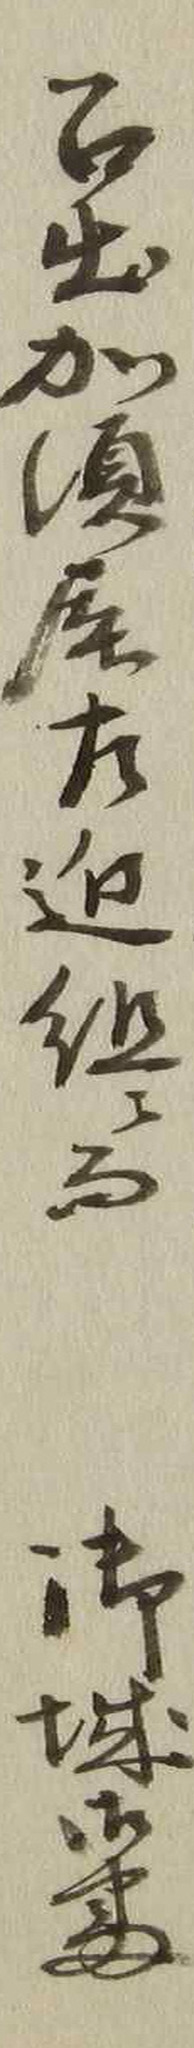召出加須屋左近組ニ而御城御番
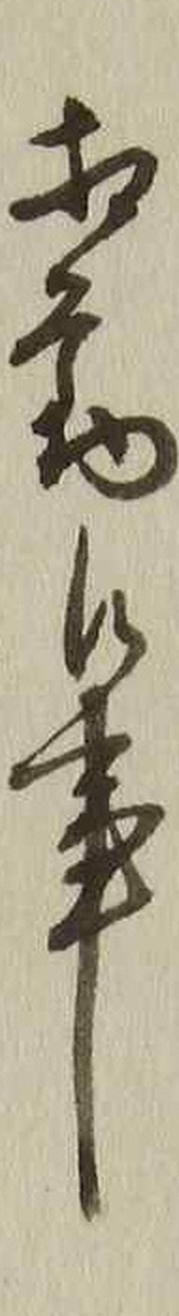相勤候事
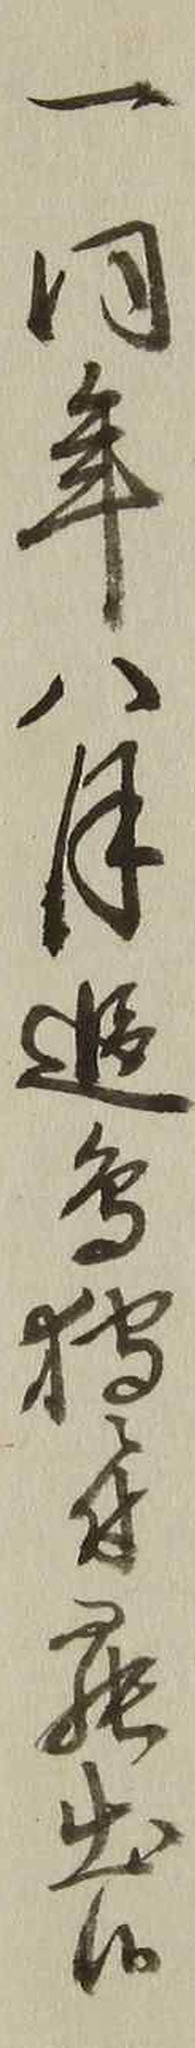一同年八月追鳥狩ニ付罷出候
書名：諸士系譜　巻之31　い之部31
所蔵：会津若松市立会津図書館
